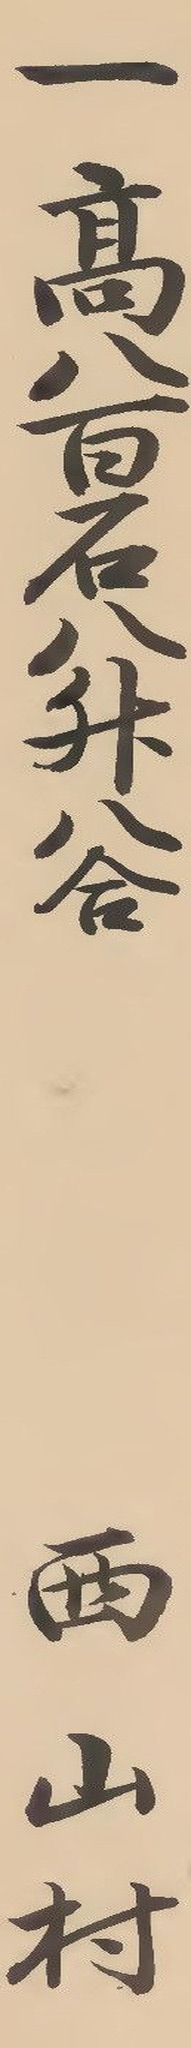一高八百石八升八合西山村
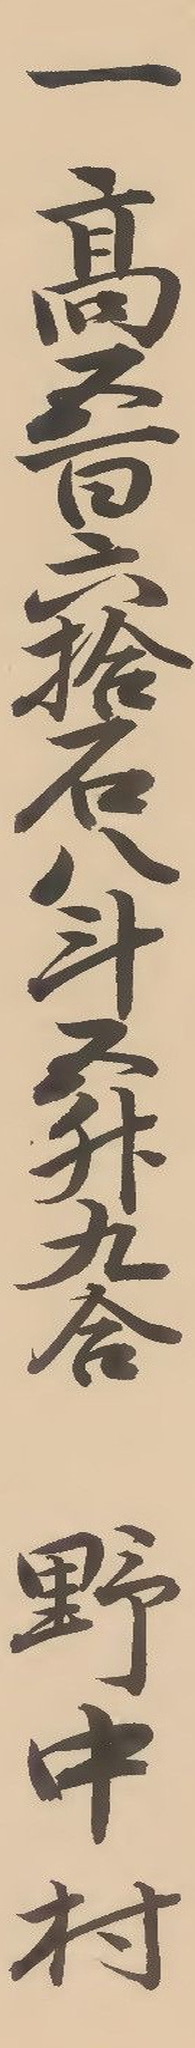一高五百六拾石八斗五升九合野中村
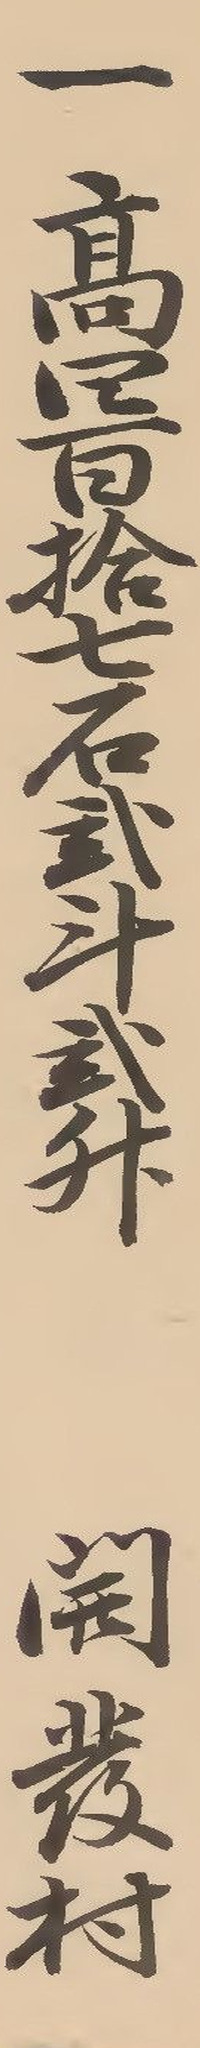一高四百拾七石弐斗弐升開発村
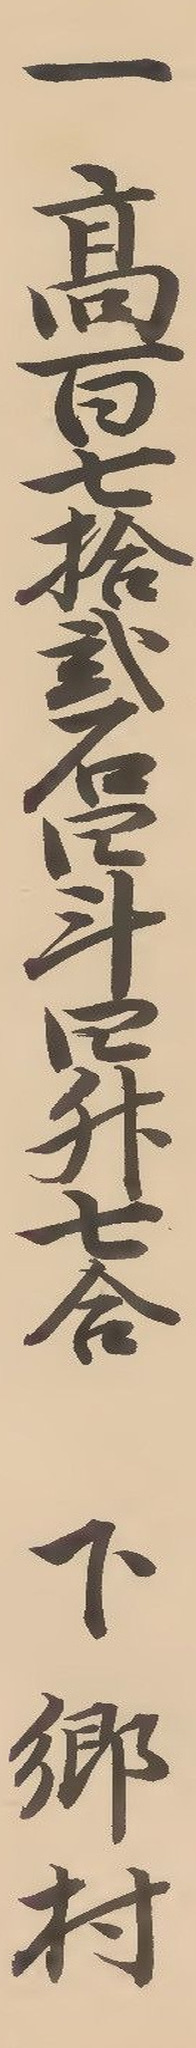一高百七拾弐石四斗四升七合下郷村
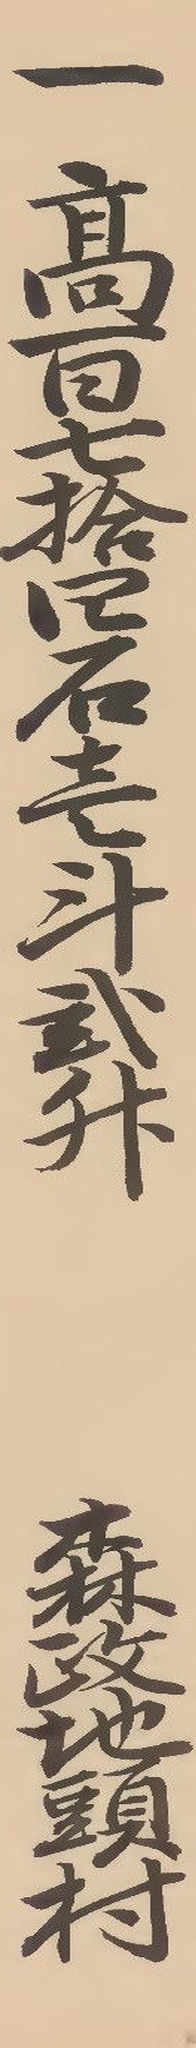一高百七拾四石壱斗弐升森政地頭村
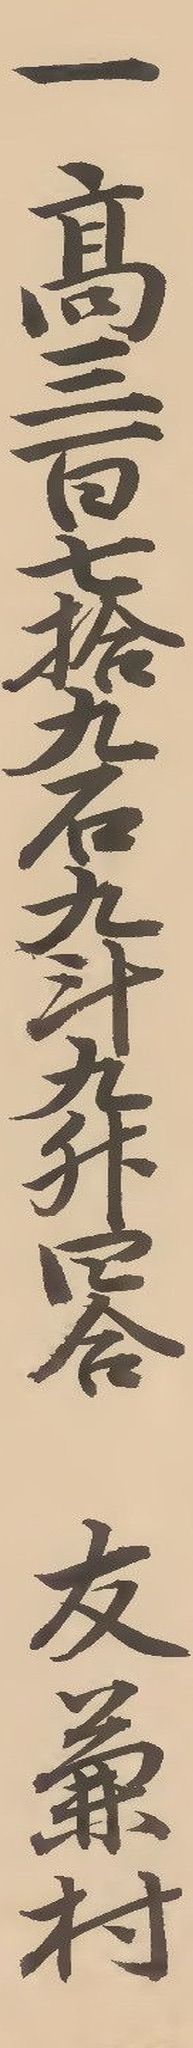一高三百七拾九石九斗九升四合友兼村
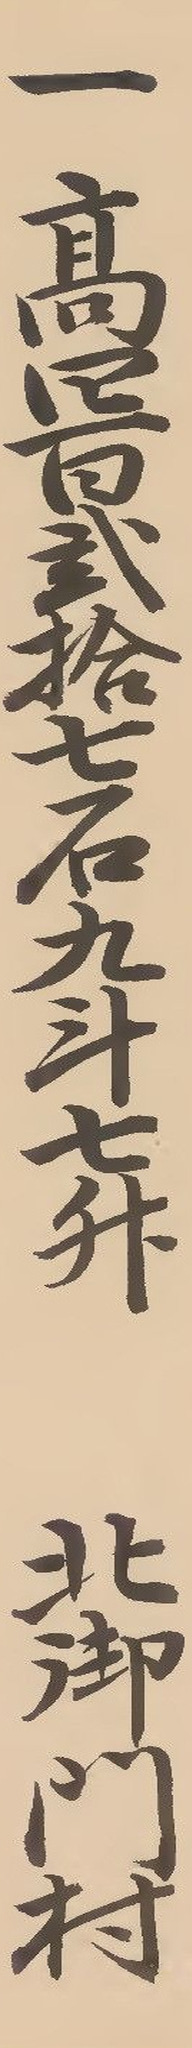一高四百弐拾七石九斗七升北御門村
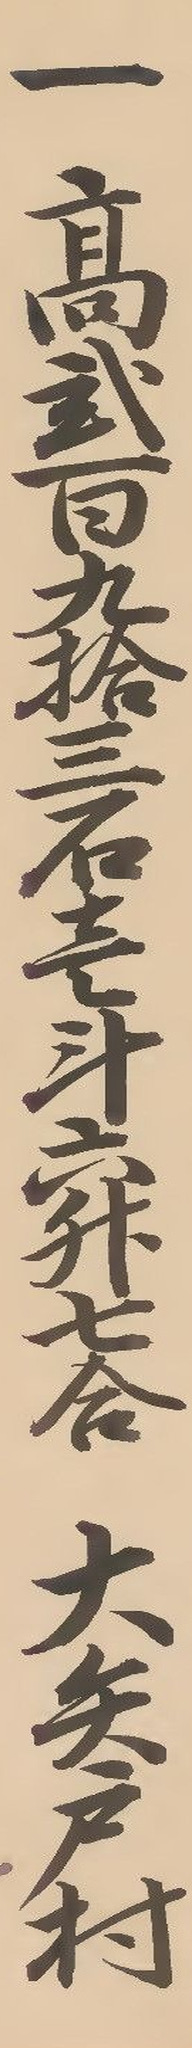一高弐百九拾三石壱斗六升七合大矢戸村

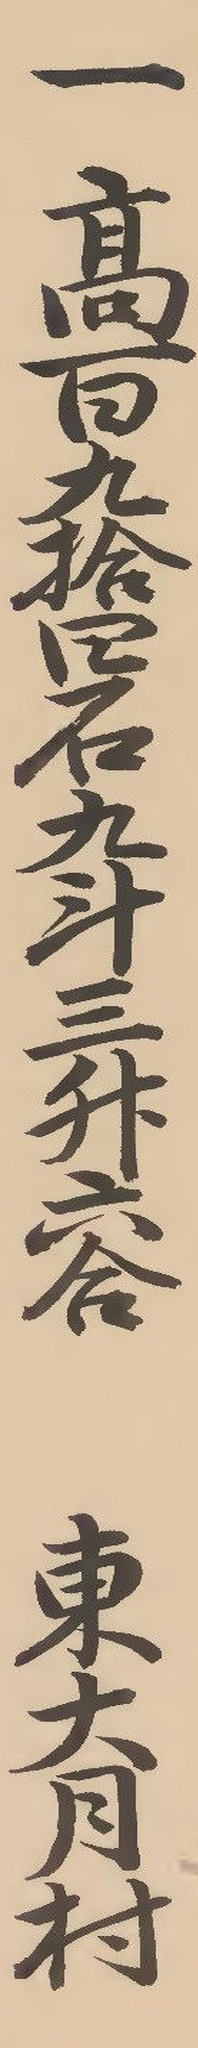一高百九拾四石九斗三升六合東大月村
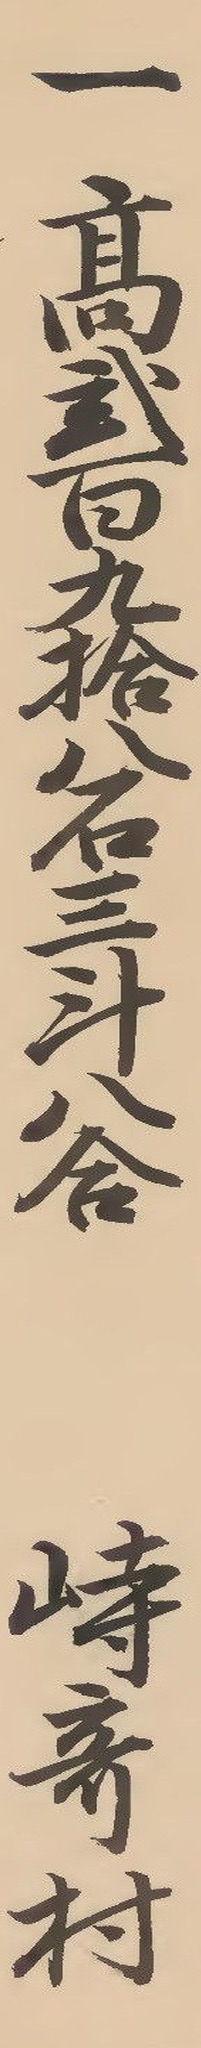一高弐百九拾八石三斗八合峙奇村
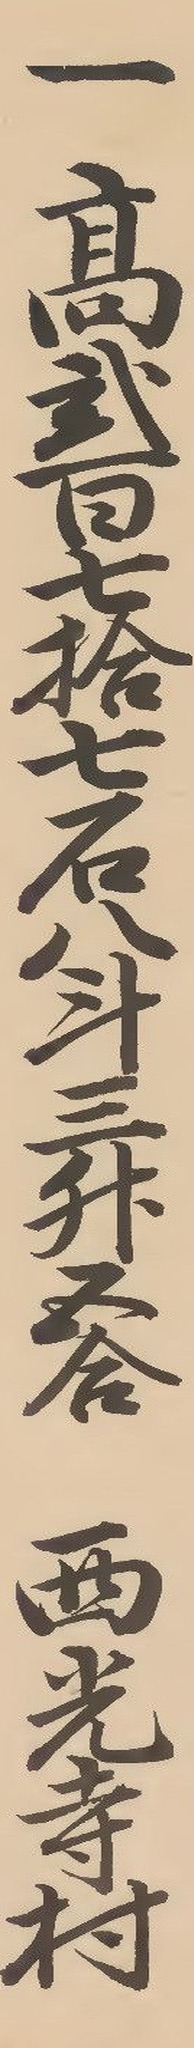一高弐百七拾七石八斗三升五合西光寺村
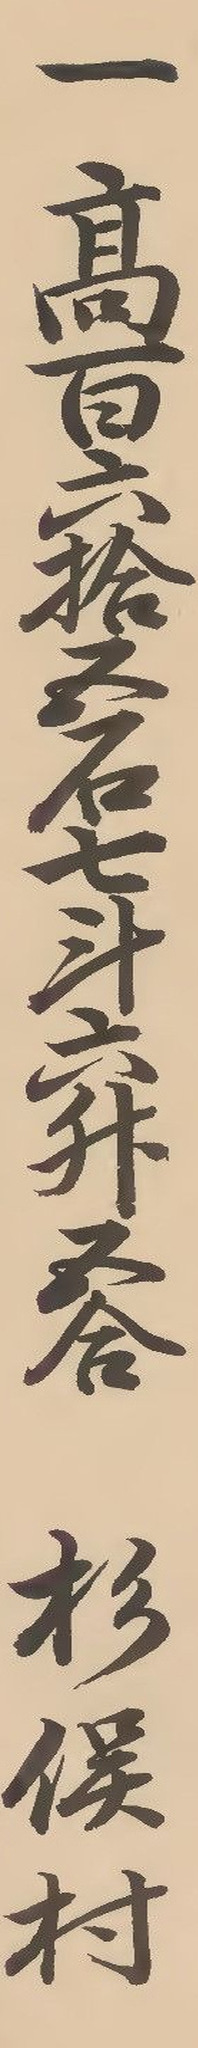一高百六拾五石七斗六升五合杉俣村
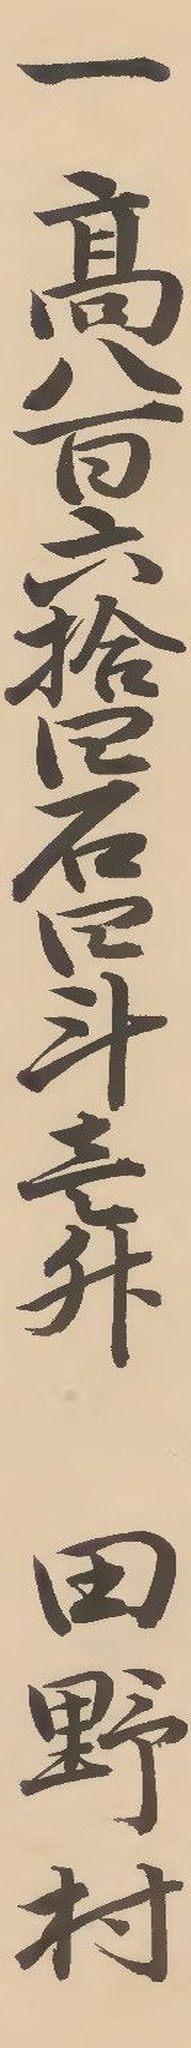一高八百六拾四石四斗壱升田野村
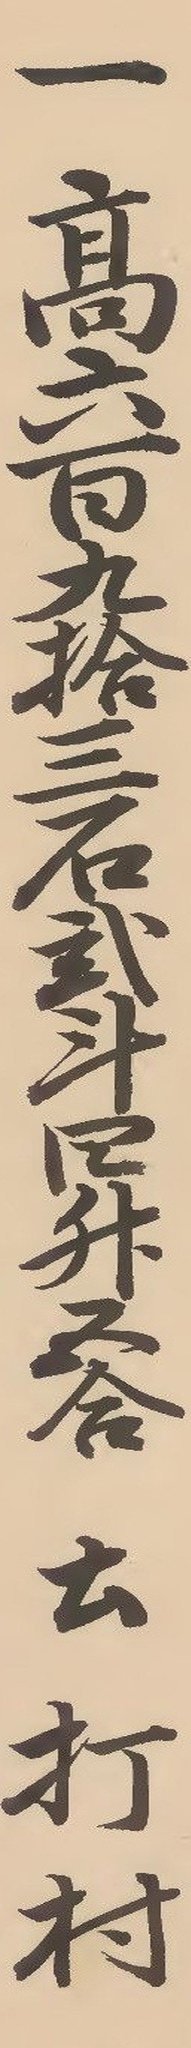一高六百九拾三石弐斗四升五合土打村
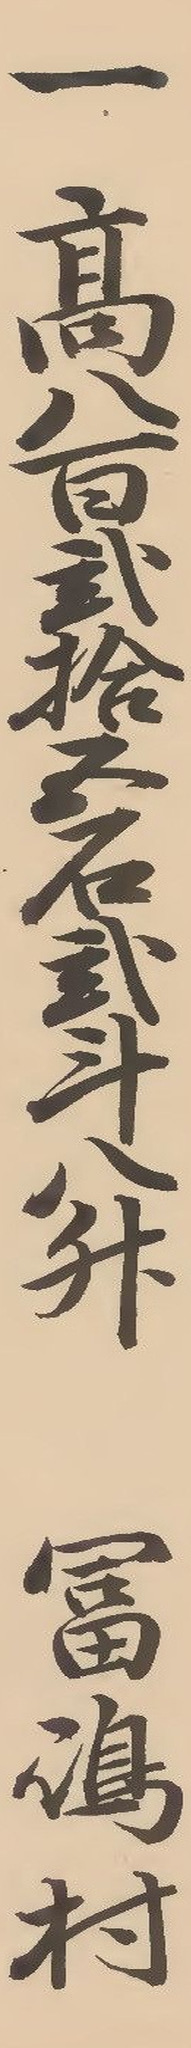一高八百弐拾五石弐斗八升富島村
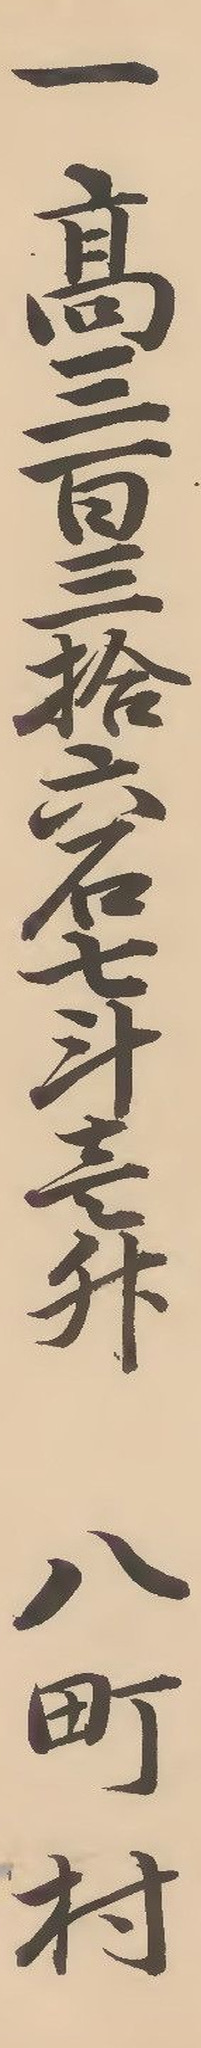一高三百三拾六石七斗壱升八町村
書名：越前国郷帳
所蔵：国立公文書館 National Archives of Japan
